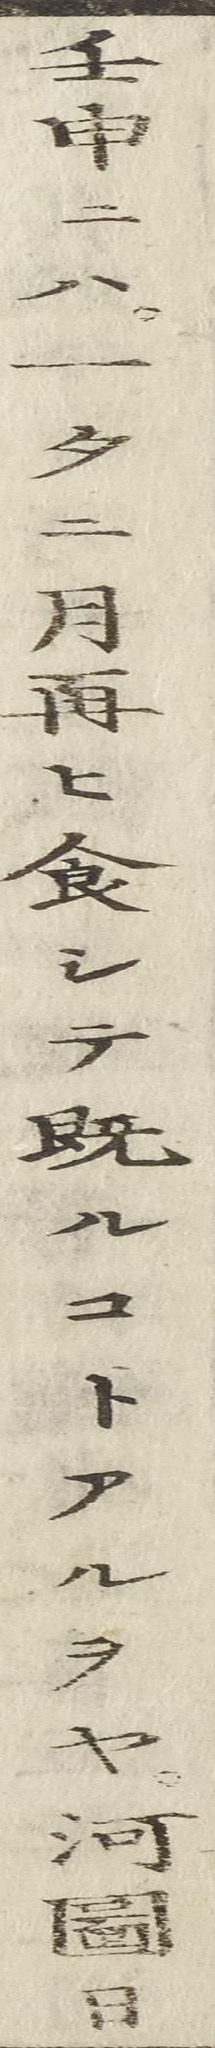壬申ニハ。一夕ニ月再ヒ食シテ既ルコトアルヲヤ。河図日
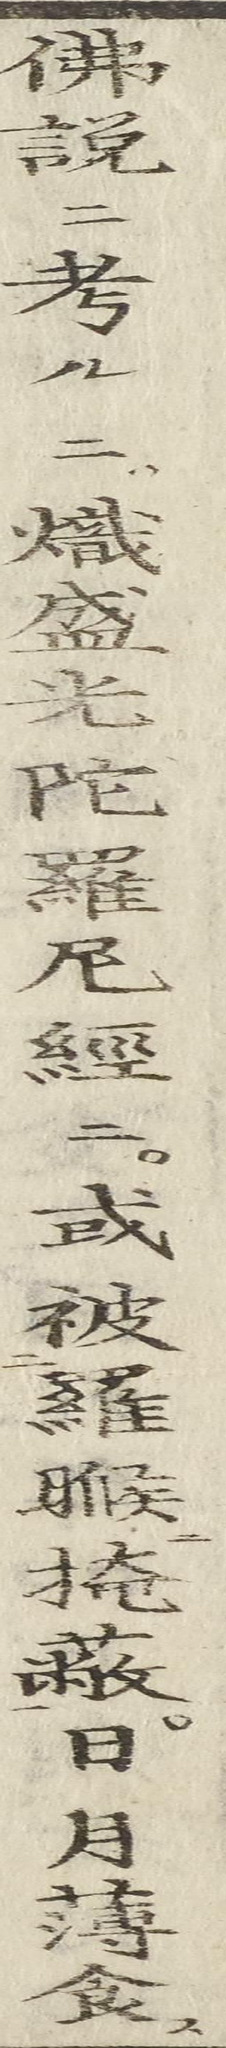仏説ニ考ルニ。熾盛光陀羅尼経ニ。或被ニ羅睺掩蔽。日月薄食
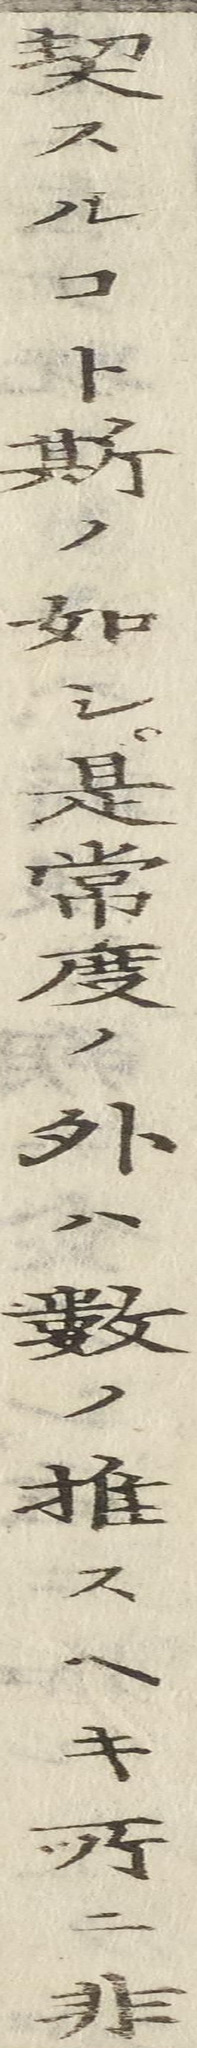契スルコト斯ノ如シ。是常度ノ外ハ数ノ推スヘキ所ニ非
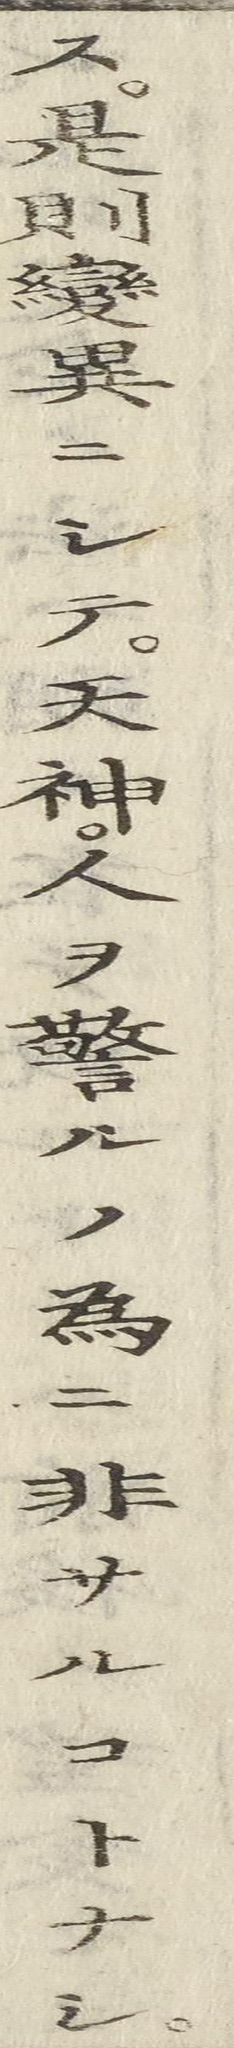ス。是則変異ニシテ。天神。人ヲ警ルノ為ニ非サルコトナシ。
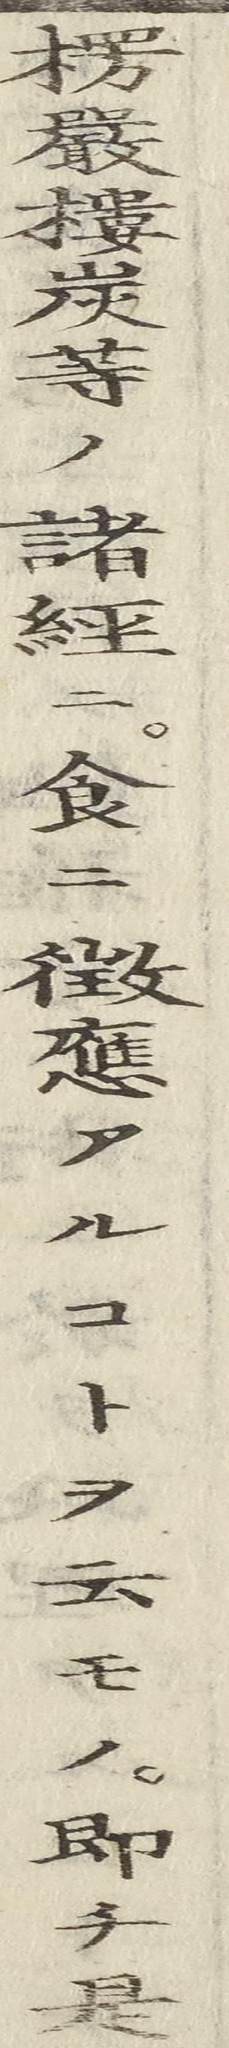楞厳楼炭等ノ諸経ニ。食ニ徴応アルコトヲ云モノ。即チ是
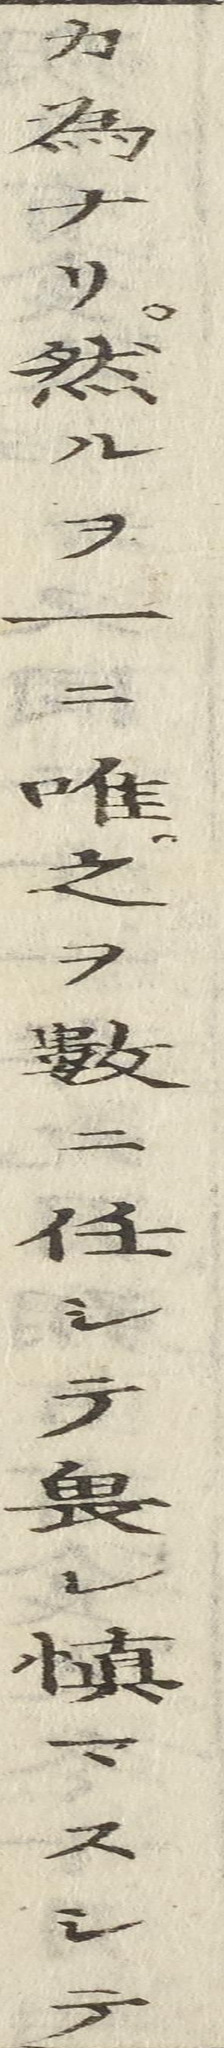カ為ナリ。然ルヲ一ニ唯。之ヲ数ニ任シテ畏レ慎マスシテ
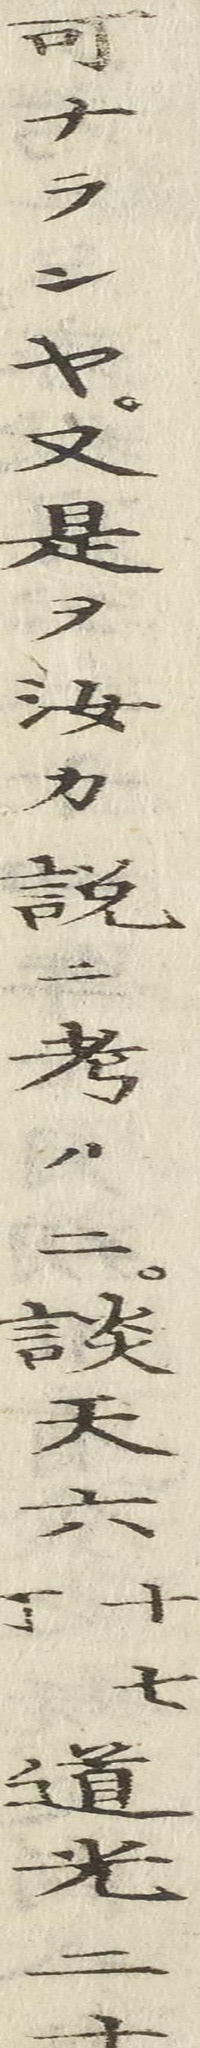可ナランヤ。又是ヲ汝カ説ニ考ルニ。談天六十七丁道光二十
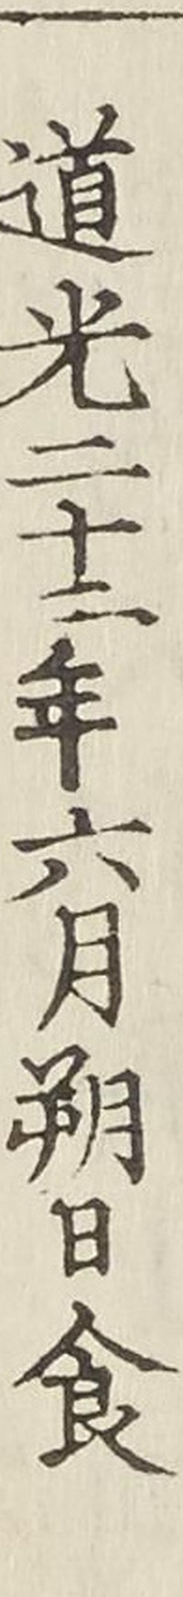道光二十二年六月朔日日食
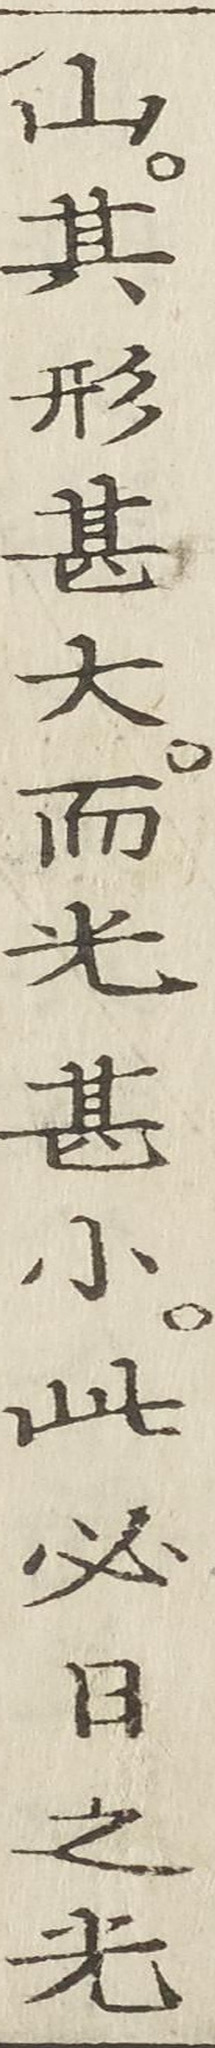山。其形甚大。而光甚小。此必日之光
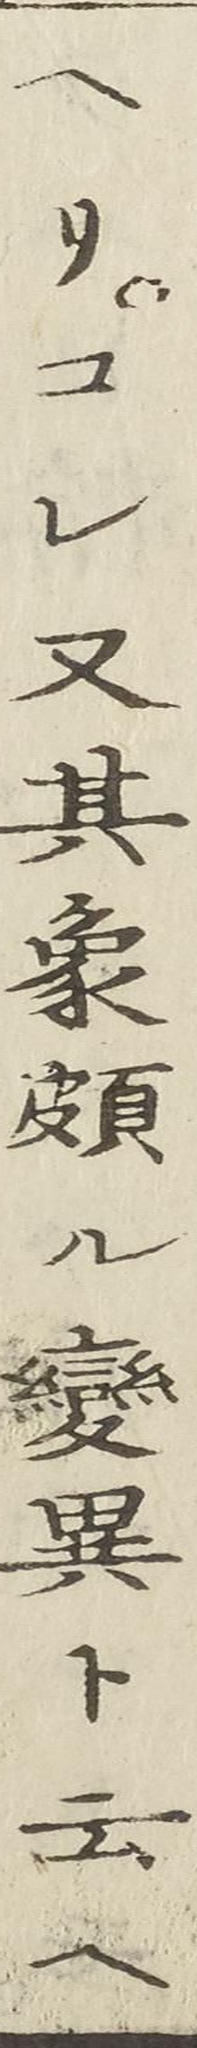ヘリ。コレ又其象頗ル変異ト云ヘ
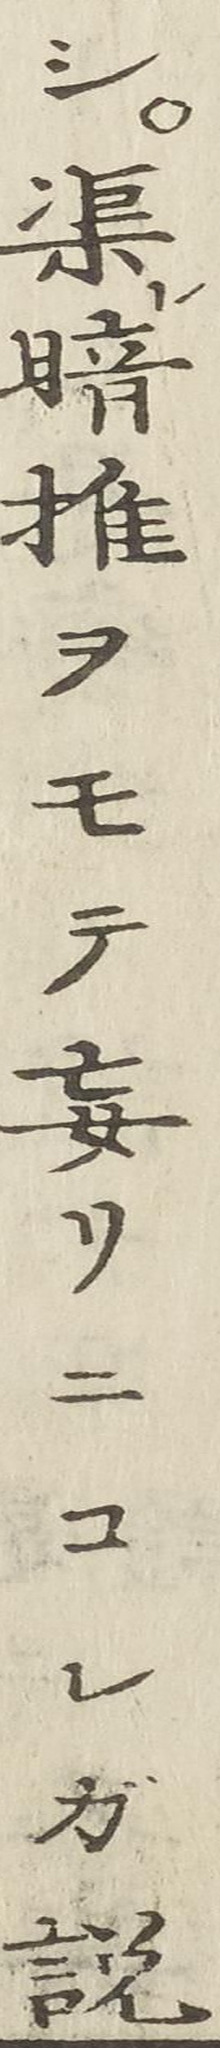シ。渠暗推ヲモテ妄リニコレガ説
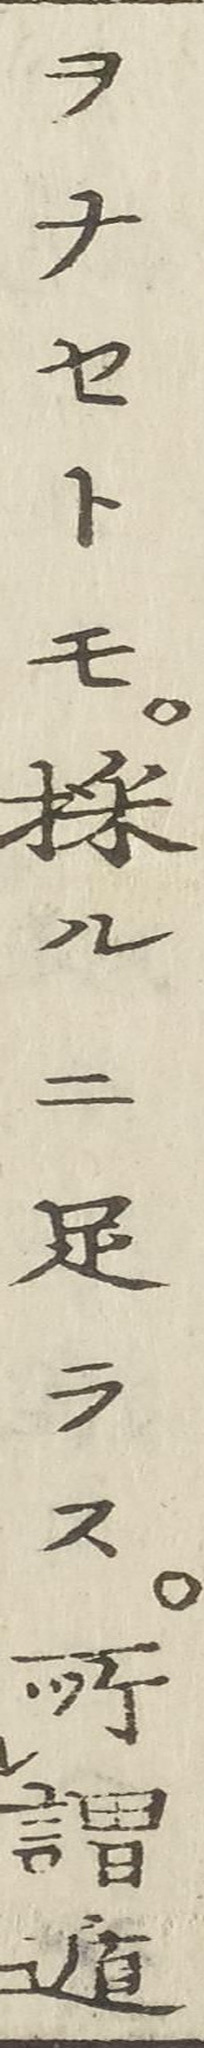ヲナセトモ。採ルニ足ラス。所謂遁
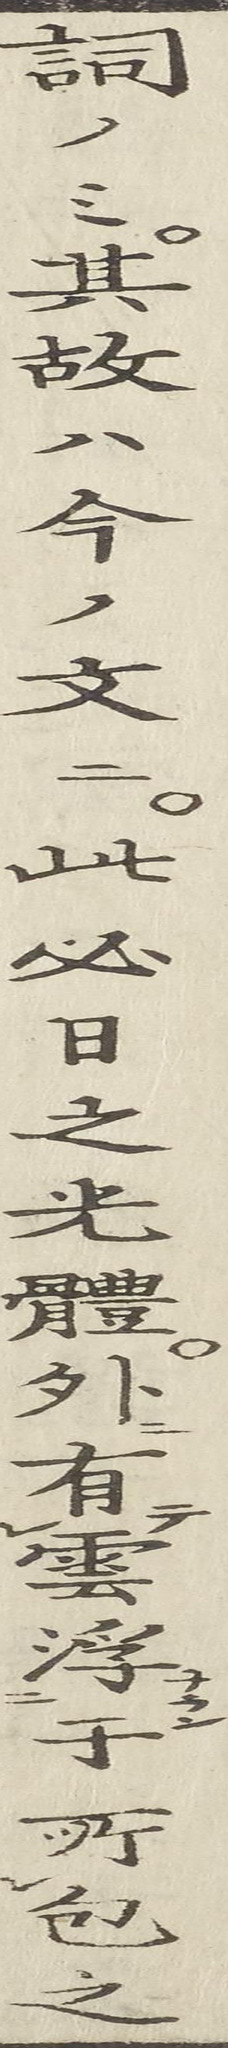詞ノミ。其故ハ今ノ文ニ。此必日之光体。外有雲浮ニ干所包之
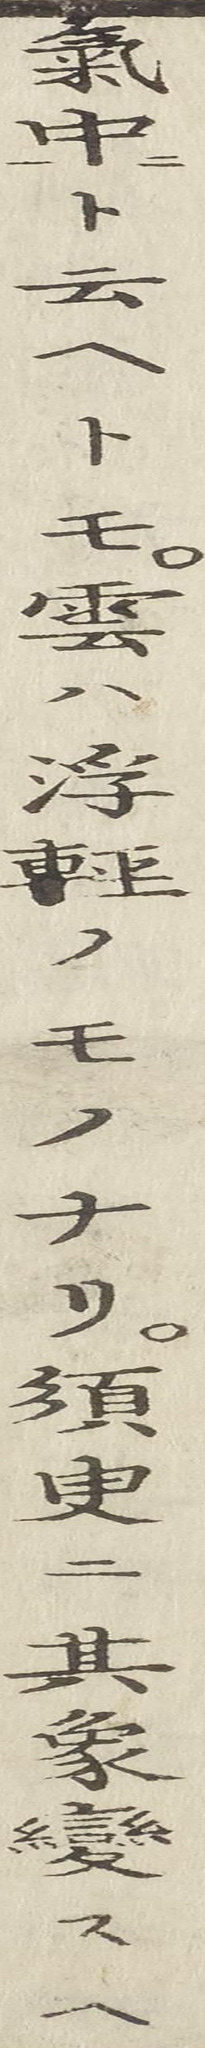気中云ヘトモ。雲ハ浮軽ノモノナリ。須臾ニ其象変スヘ
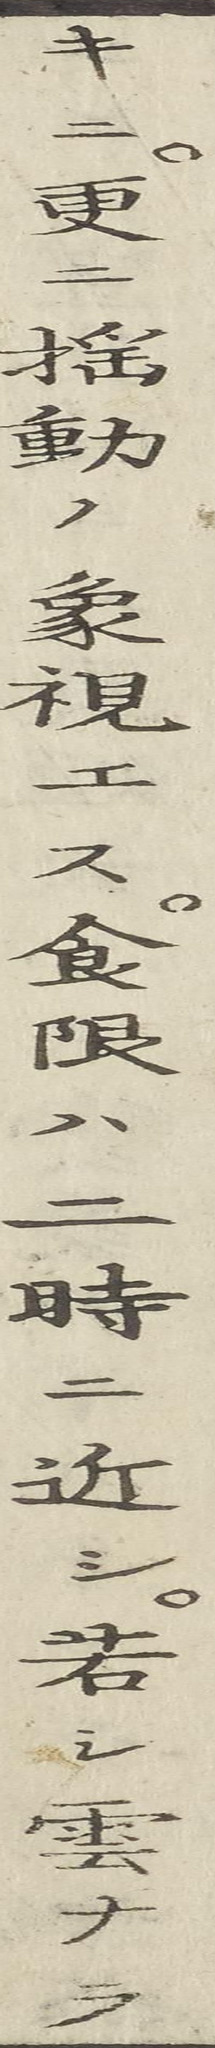キニ。更ニ揺動ノ象視エス。食限ハ二時ニ近シ。若シ雲ナラ

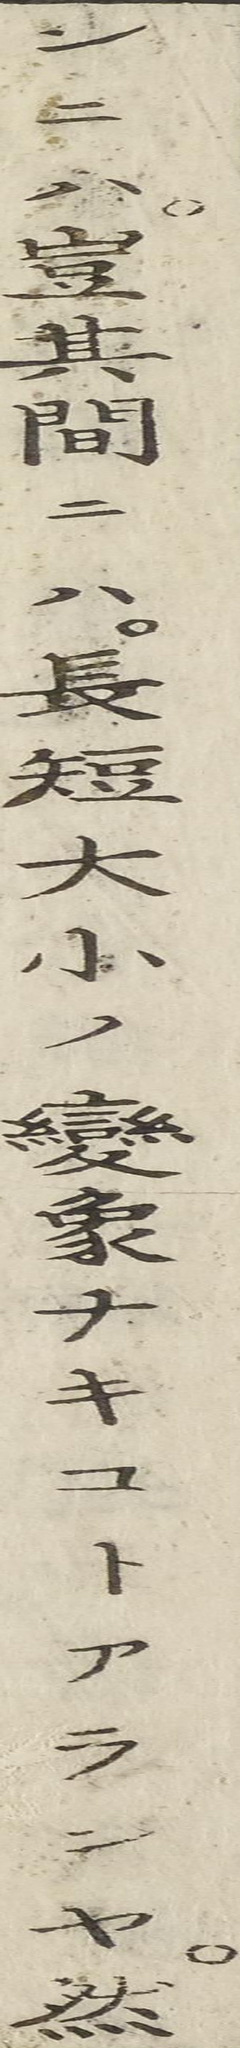ンニハ。豈其間ニハ。長短大小ノ変象ナキコトアランヤ。然
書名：護法新論　二編　下
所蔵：東京大学地震研究所図書室 Earthquake Research Institute Library, The University of Tokyo, JAPAN
